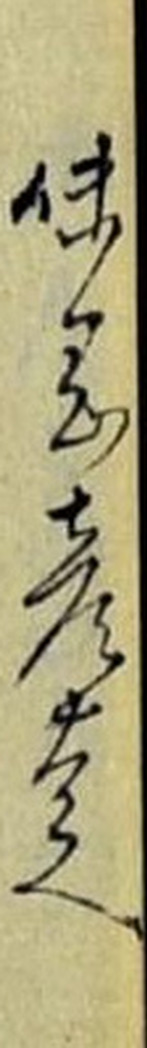味岡彦大夫
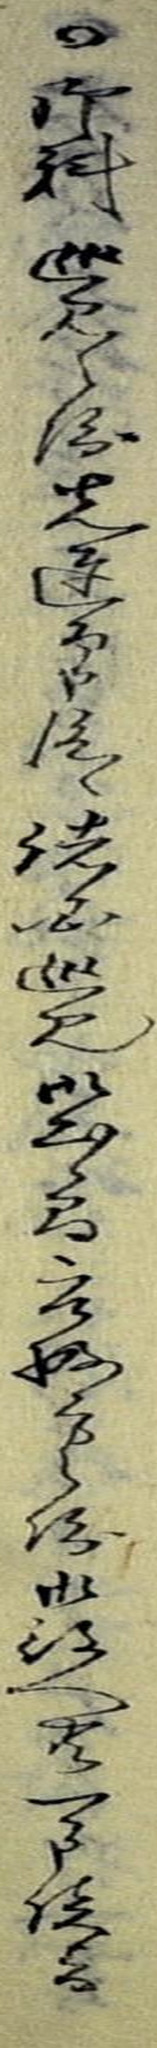〇御料巡見之儀先達而申渡候諸国巡見御出候間取扱方之儀御役人共可申談旨
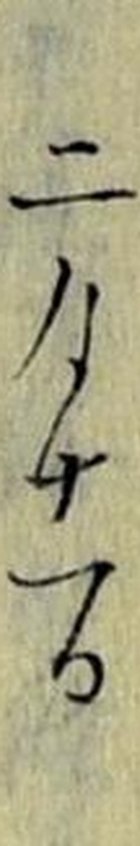二月十一日
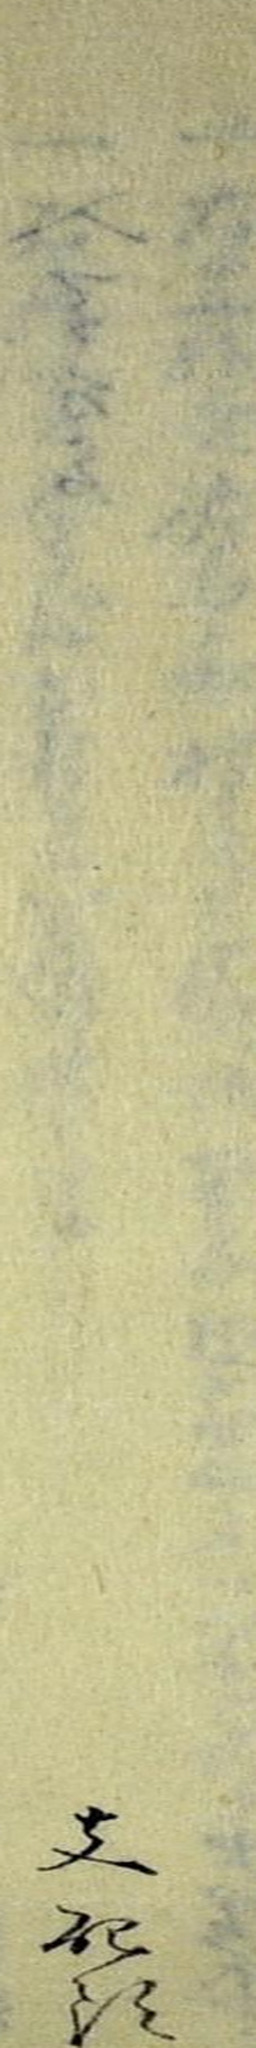支配頭
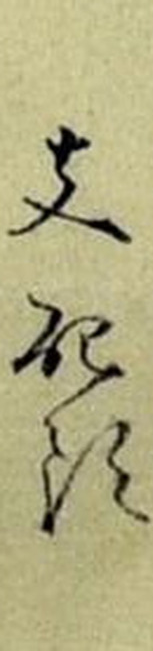支配頭
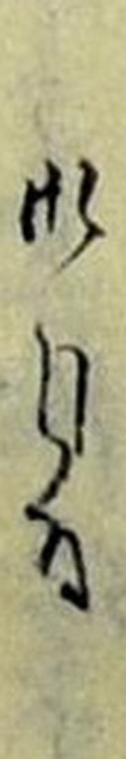御目付
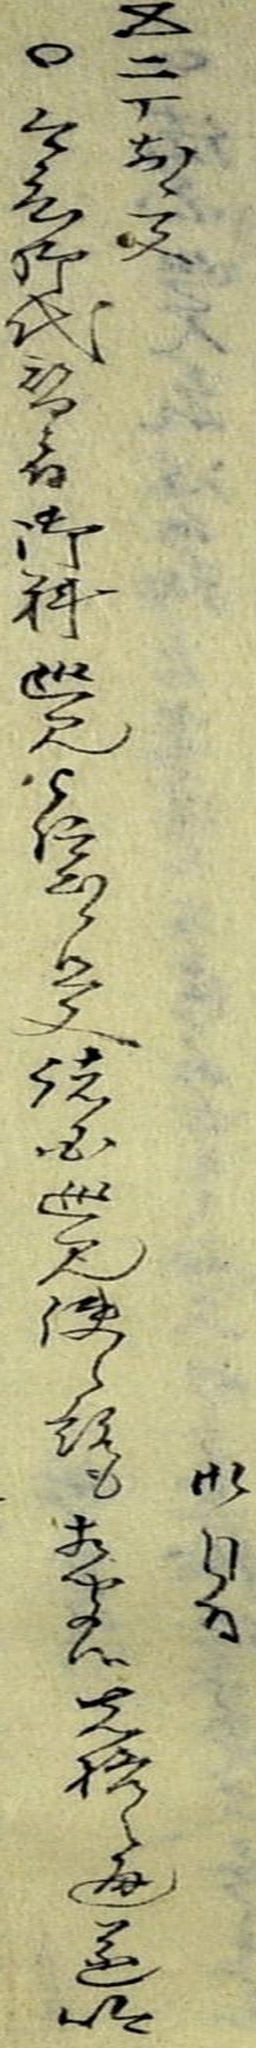〇今度御代替ニ付御料巡見被仰出候且又諸国巡見使之趣も相聞候先格之通遂吟
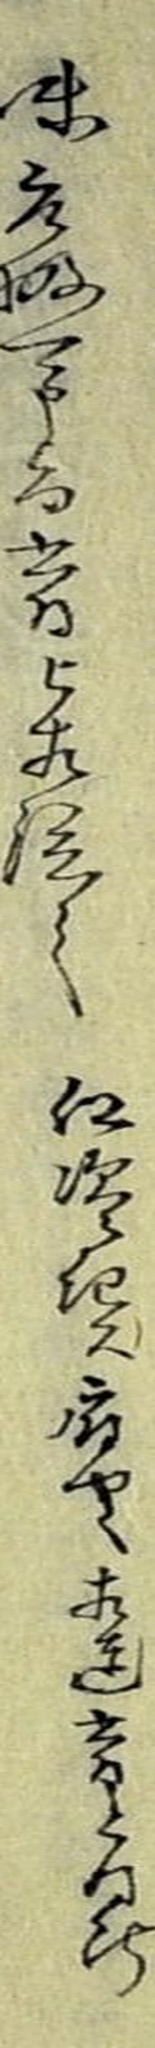味取扱可申旨書付被相渡之但次ニ記ス府中へ相達書付と同断
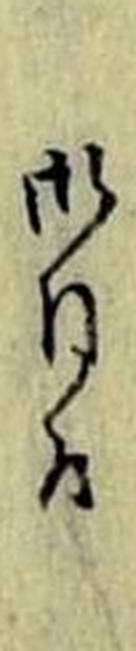御目付
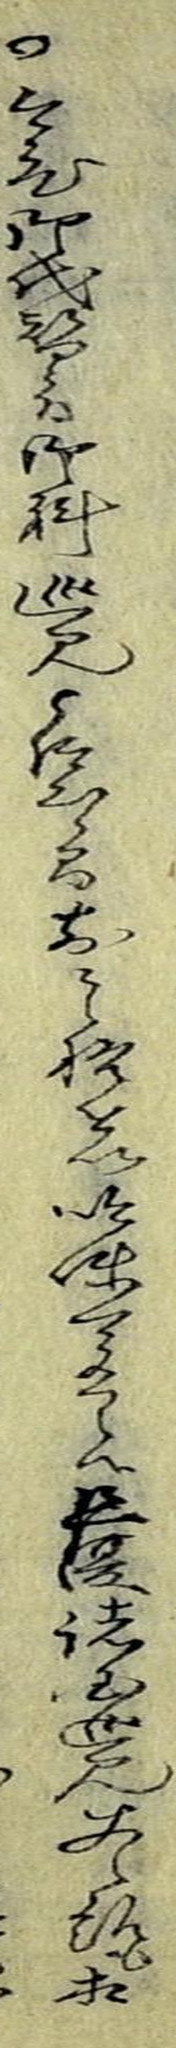〇今度御代替ニ付御料巡見被仰出候間前々之格を以吟味可有之候且復諸国巡見使之趣も相
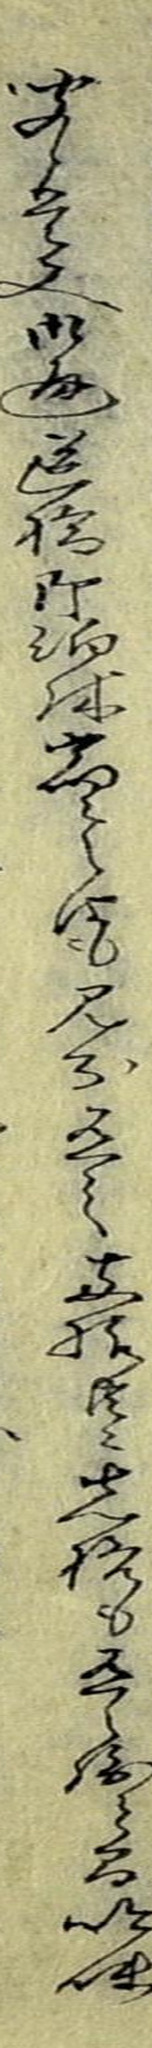聞候是又御通道橋御泊休宿之儀も見分有之両様共ニ先格も有之儀ニ候間吟味
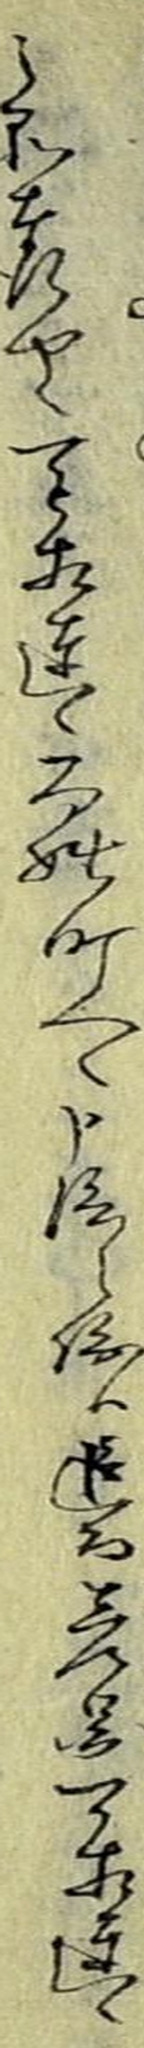之品奉行中へ可被相達候百姓町人へ申渡之儀ハ追而差図可相達候
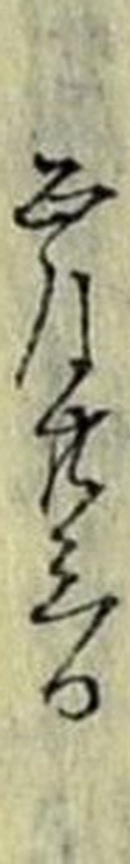正月廿三日
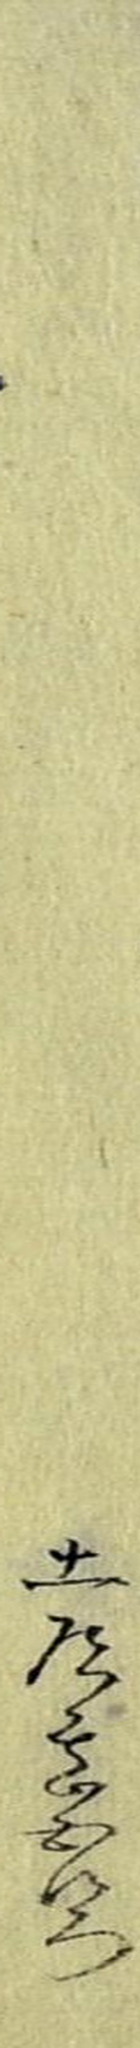土屋甚五左衛門
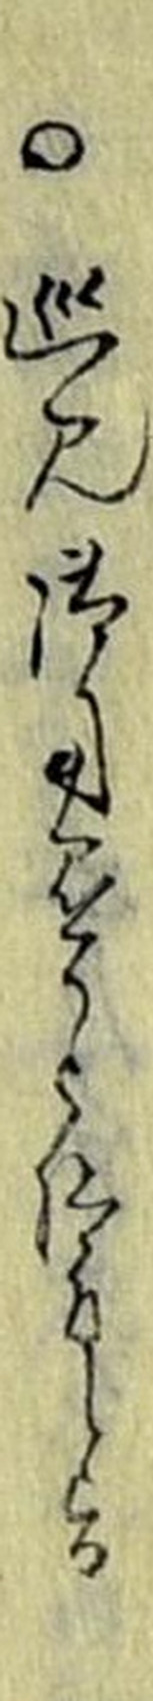〇巡見御用懸り被仰付候旨

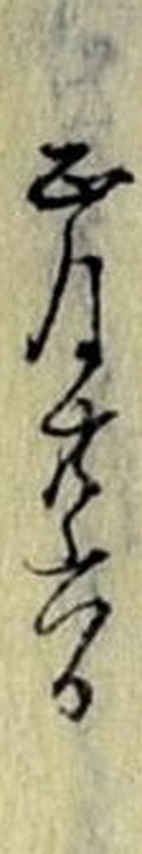正月廿六日
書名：命令之部 一
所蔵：福井県文書館 Fukui Prefectural Archives
